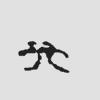亓（其）
